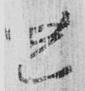也
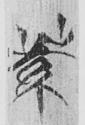○（萦）
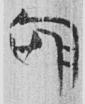含（今）
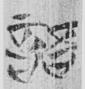語
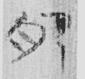肥
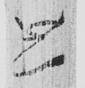也
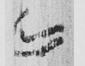㠯（以）
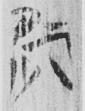凥（處）
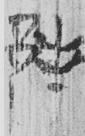邦
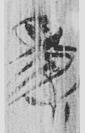○（家）
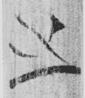之
